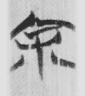余
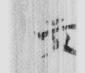亓
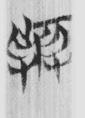與
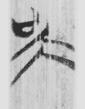吳
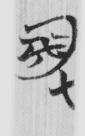{釆斗}
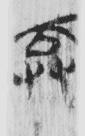弃
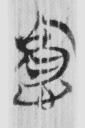{肙心}
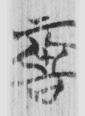{亞口}
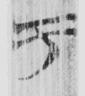于
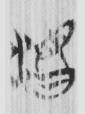{水母日}
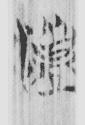{水比𥁕}
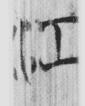江
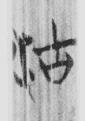沽
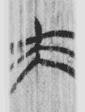夫
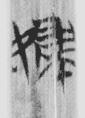婦
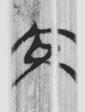交
